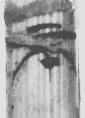不
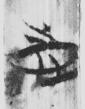志
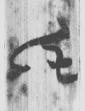氒
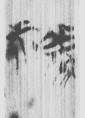{示羕}
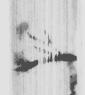之
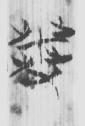{歮又}
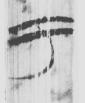于
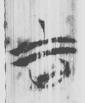吉
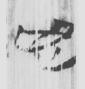兇
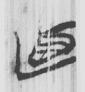廼
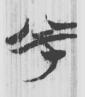兮
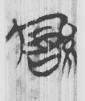{人言系}
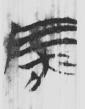庶
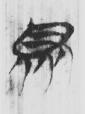眾
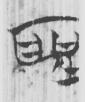聖
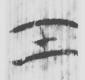壬
